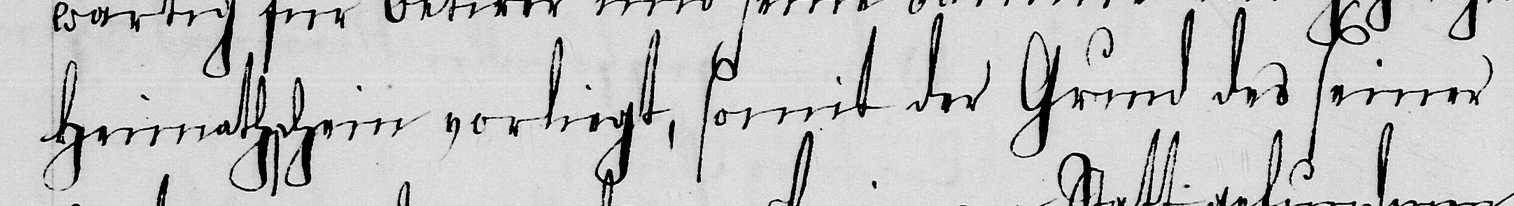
Heimathschein vorliegt, somit der Grund des seiner
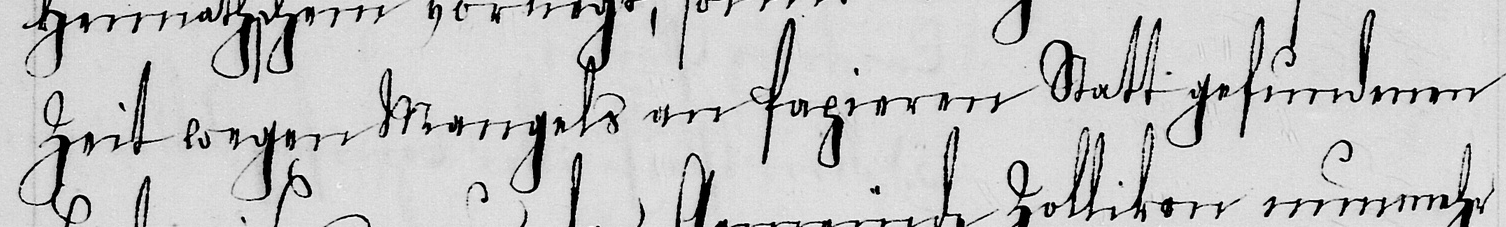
Zeit wegen Mangels an Papieren Statt gefundenen
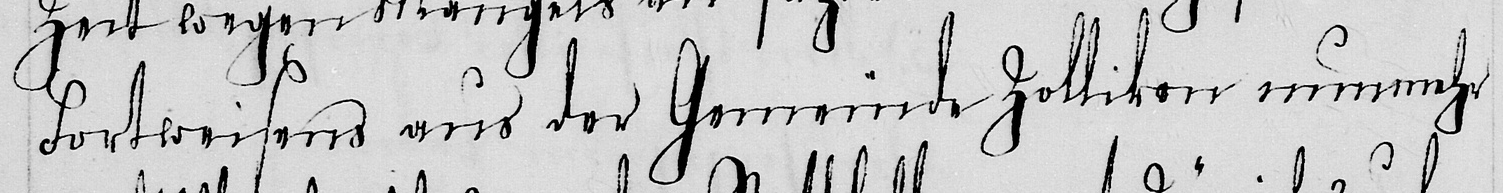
Fortweisens aus der Gemeinde Zollikon nunmehr
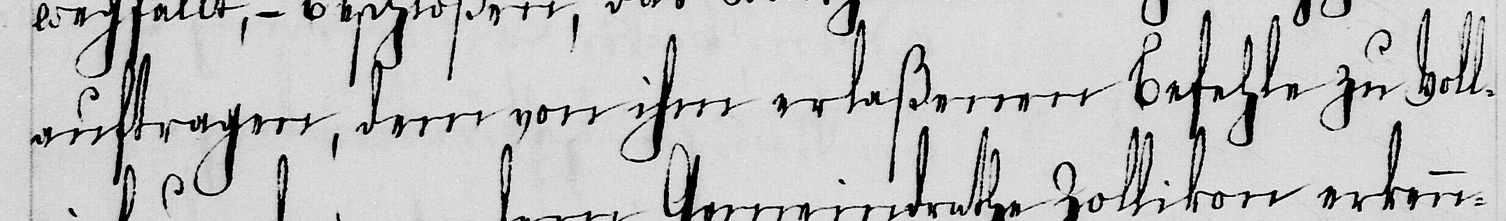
auftragen, dem von ihm erlaßenen Befehle zu Vol¬
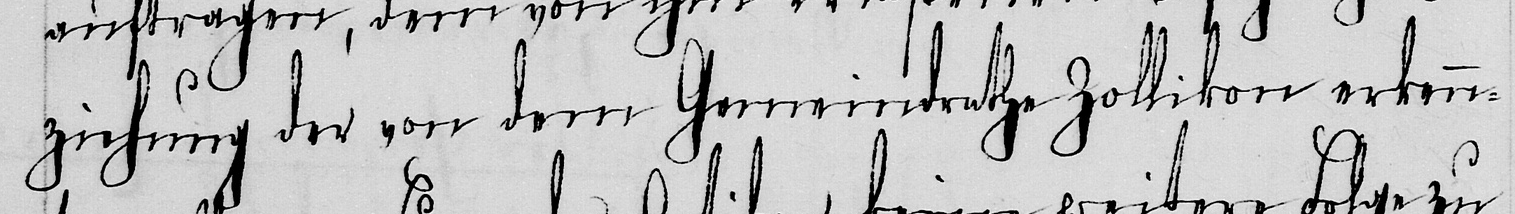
lziehung der von dem Gemeindrathe Zollikon erkenn¬
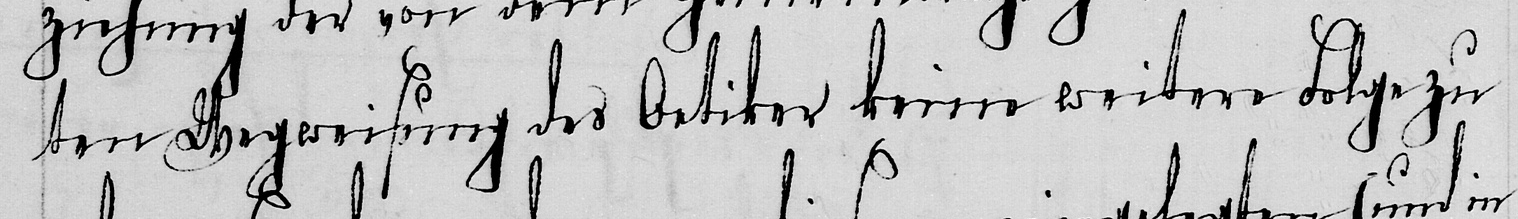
ten Wegweisung des Oetiker keine weitere Folge zu
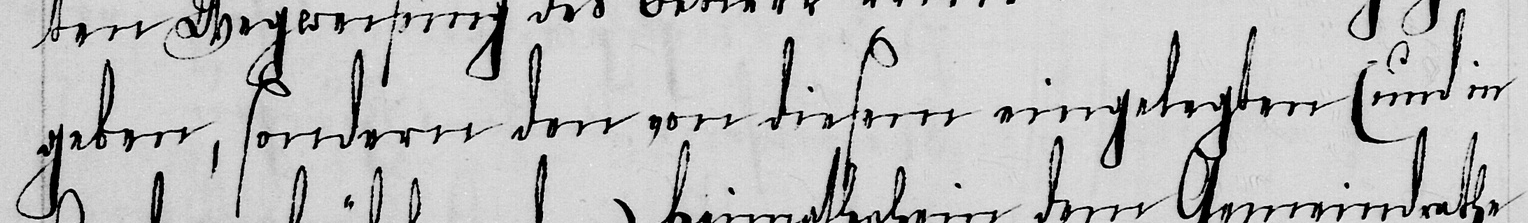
geben, sondern den von diesem eingelegten (und in
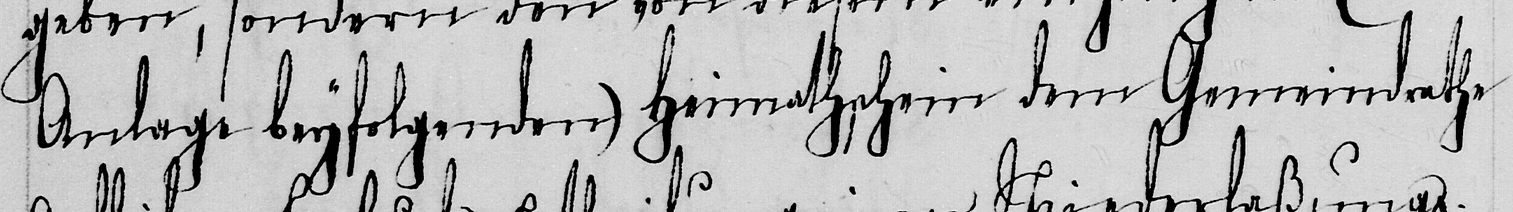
Anlage beyfolgenden) Heimathscheine dem Gemeindrathe
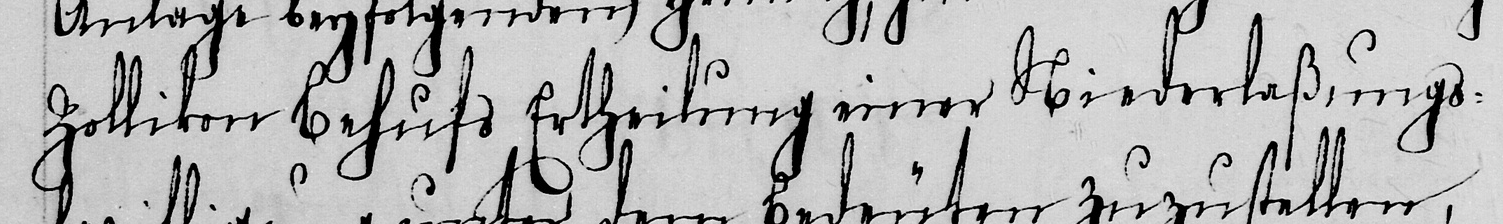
Zollikon Behufs Ertheilung einer Niederlaßungs¬
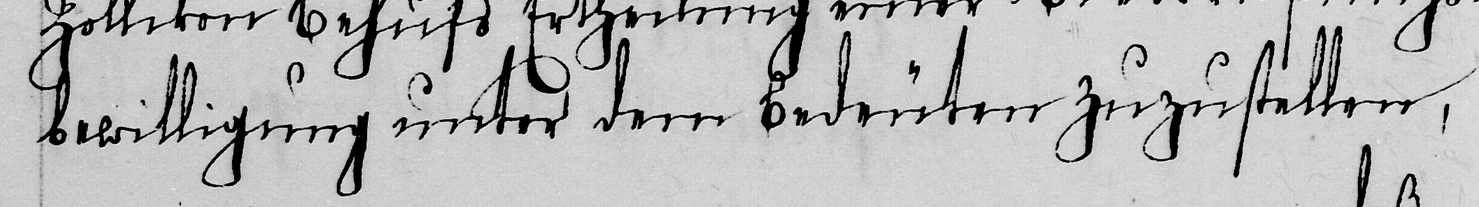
bewilligung unter dem Bedeuten zuzustellen,
